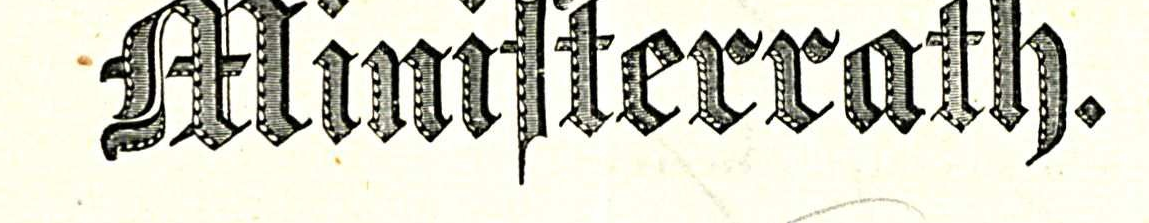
Ministerrat.
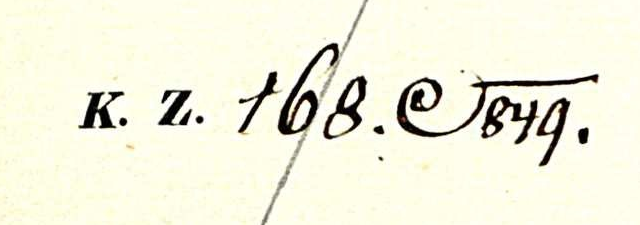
K.Z. 68. xx849.
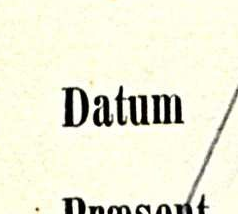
Datum
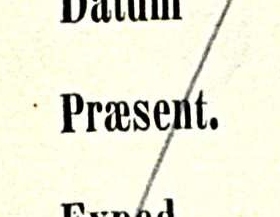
Præsent.
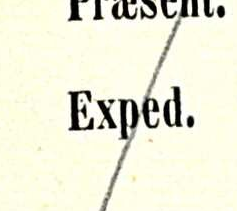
Exped.
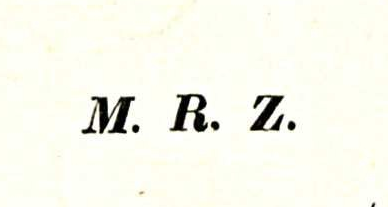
M.R.Z.
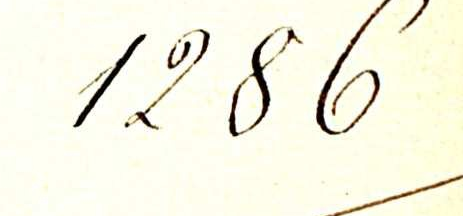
1286
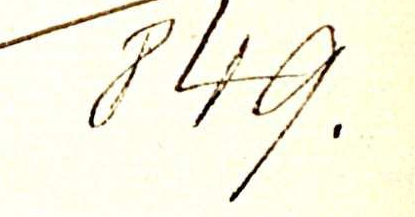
849
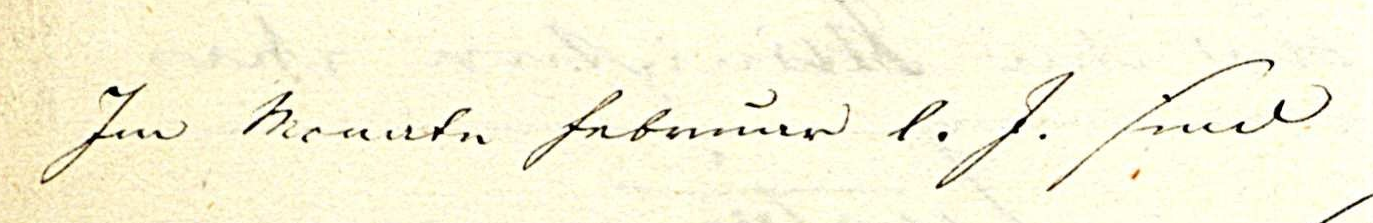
Im Monate Februar l. J. sind
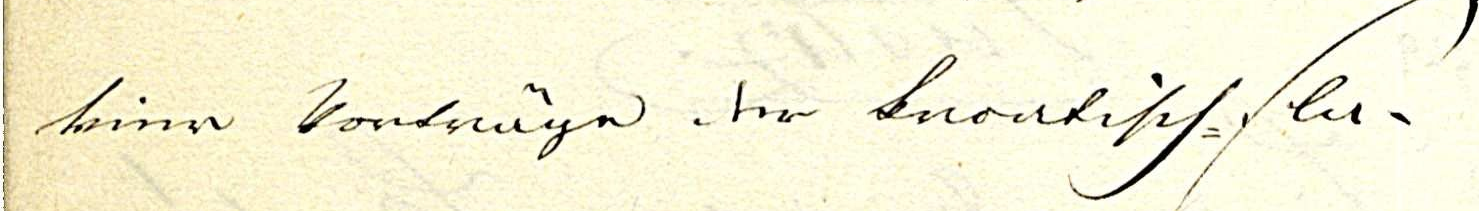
vier Vorträge der kroatisch-sla¬
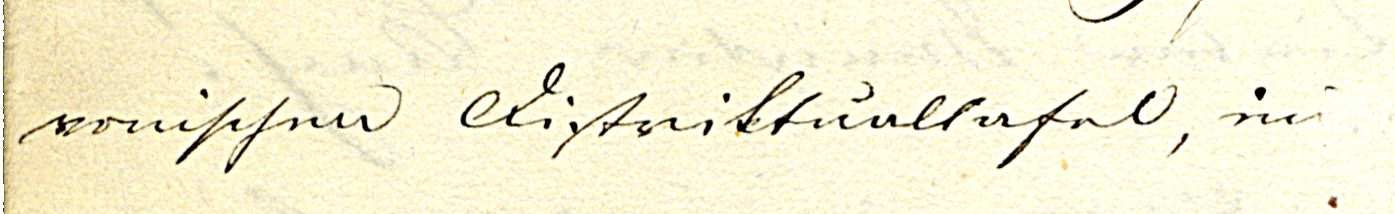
vonischen Distriktualtafel, in
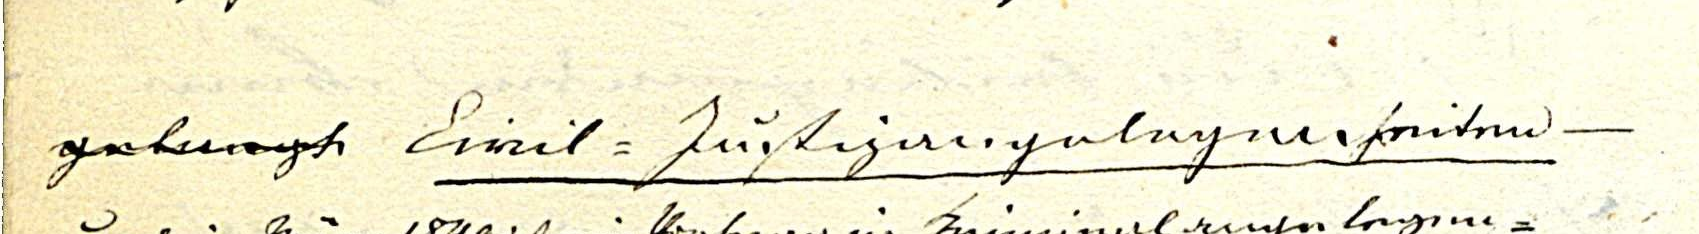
Civil=Justizangelegenheiten -
